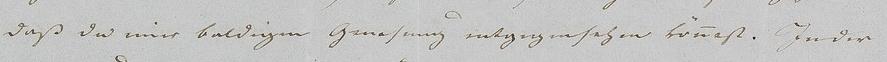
daß du einer baldigen Genesung entgegensehen könnest. In der
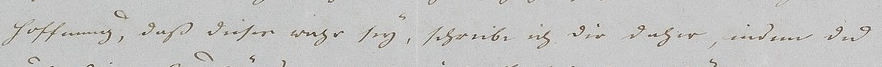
Hoffnung, daß dieses wahr sey, schreibe ich Dir daher, indem du
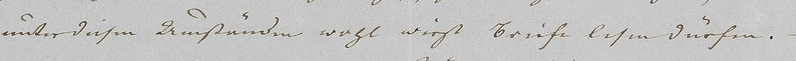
unter diesen Umständen wohl wirst Briefe lesen dürfen. –
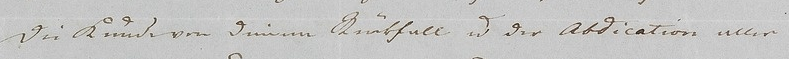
Die Kunde von Deinem Rückfall u der Abdication aller
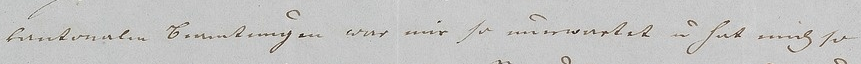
kantonalen Beamtungen war mir so unerwartet u hat mich so
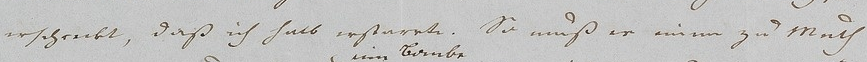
erschreckt, daß ich halb erstarrte. So muß es einem zu Muth
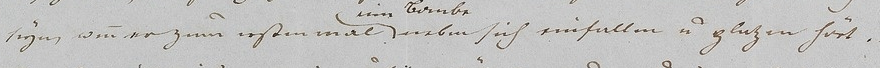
seyn, wenn es zum ersten mal eine Bombe neben sich einfallen u platzen hört. –
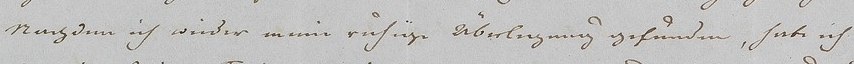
Nachdem ich wieder meine ruhige Überlegung gefunden, habe ich
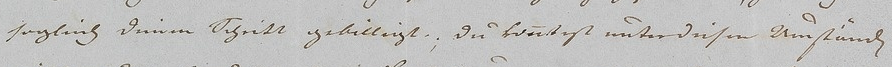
sogleich Deinen Schritt gebilligt; Du konntest unter diesen Umständen
